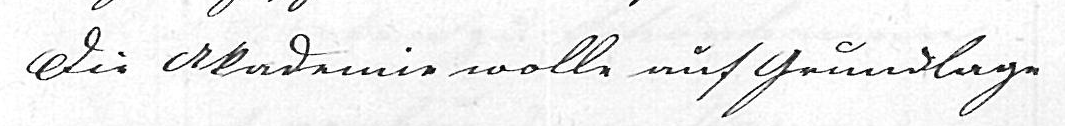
Die Akademie wolle auf Grundlage
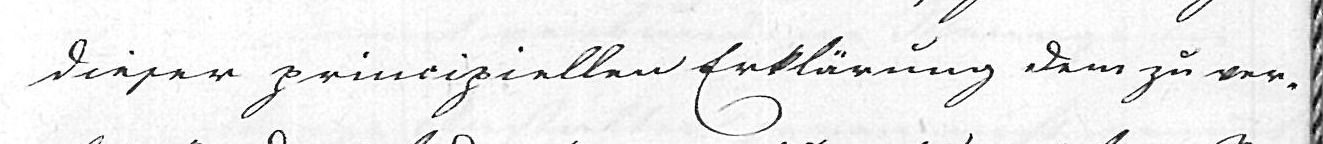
dieser principiellen Erklärung dem zu ver-
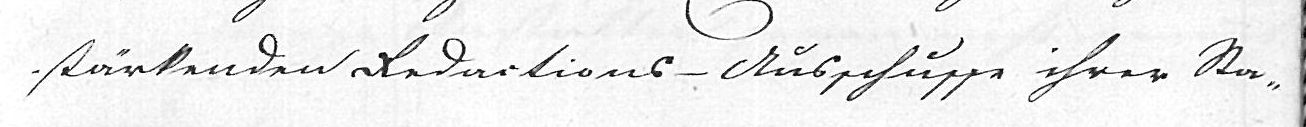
stärkenden Redactions-Ausschusse ihrer Sta-
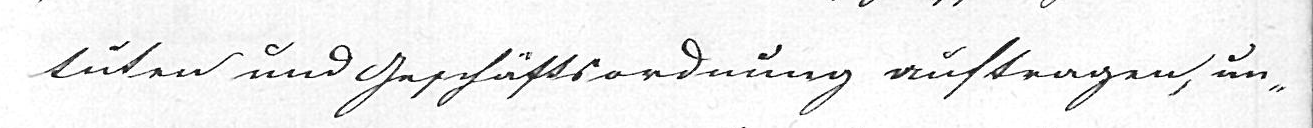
tuten und Geschäftsordnung auftragen, un-
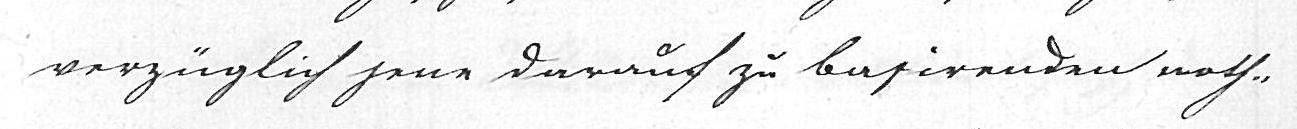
vorzüglich jene darauf zu basirenden noth-
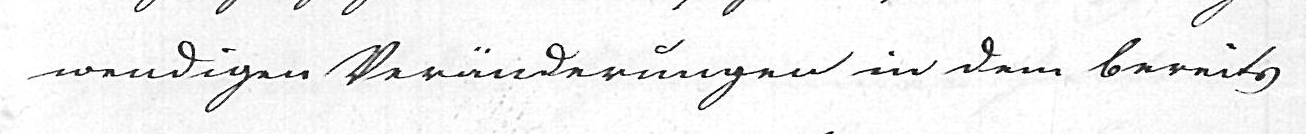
wendigen Veränderungen in dem bereits
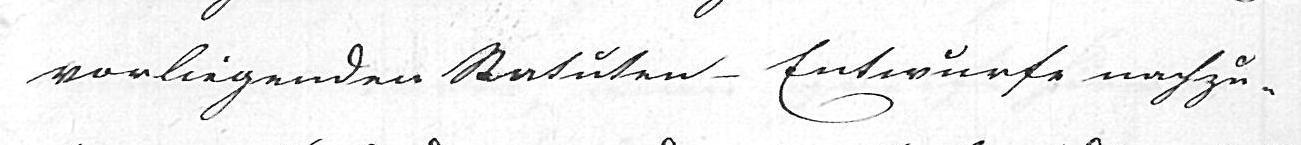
vorliegenden Statuten-Entwurfe nachzu-
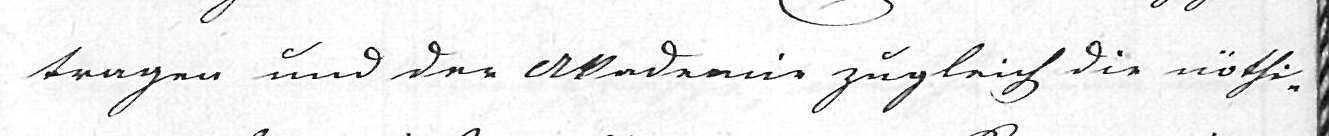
tragen und der Akademie zugleich die nöthi-
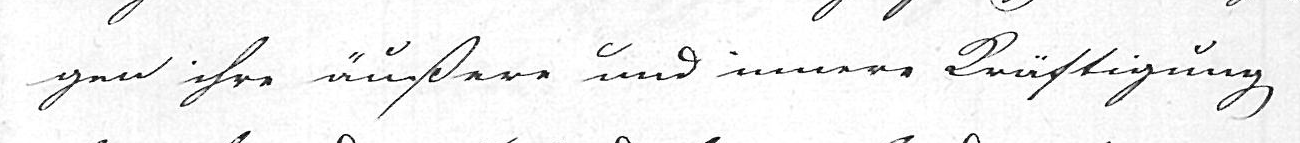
gen ihre äußere und innere Kräftigung
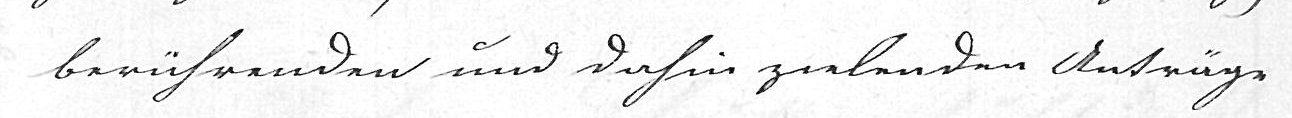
berührenden und dahin zielenden Anträge
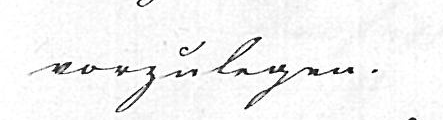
vorzulegen.
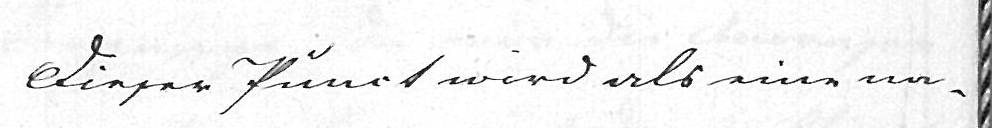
Dieser Punct wird als eine na-
